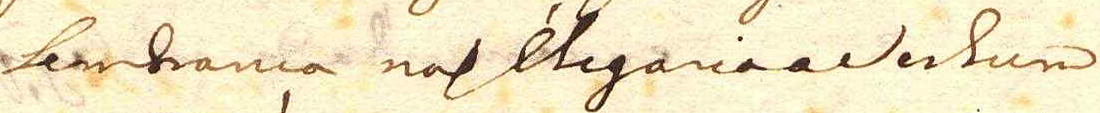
lembrança naõ chegaria a ser hum
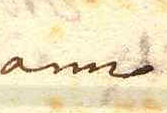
anno.
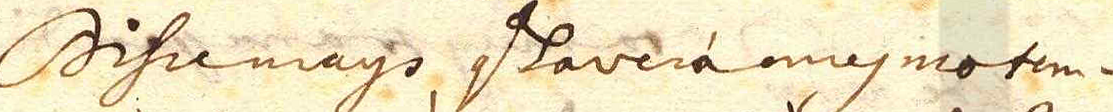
Disse mays, q̄ haverá o mesmo tem
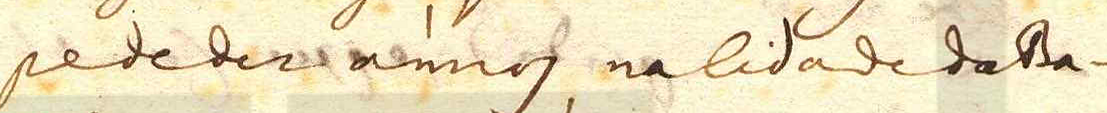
po de dez annos, na cidade da Ba
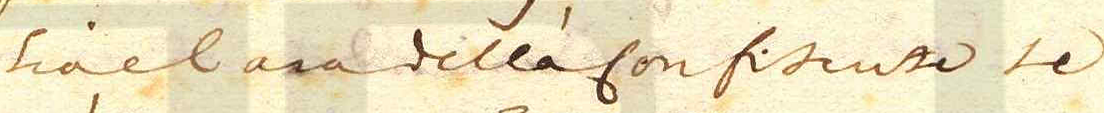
hia e caza della Confitente se
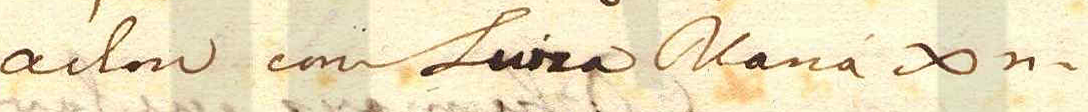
achou com Luiza Maria x n.
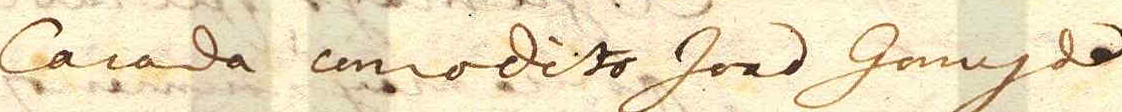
Cazada com o dito Joaõ Gomes de
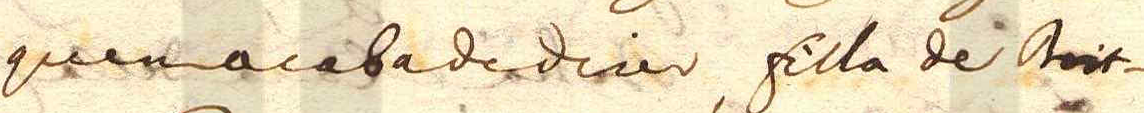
quem acaba de dizer, filha de Brit
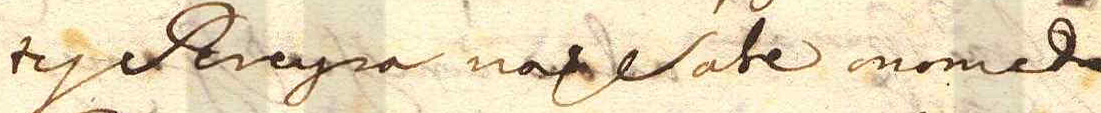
tes Pereyra naõ sabe o nome do
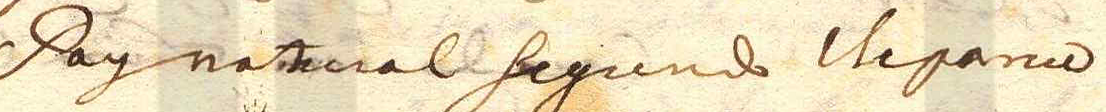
Pay natural segundo lhe parece
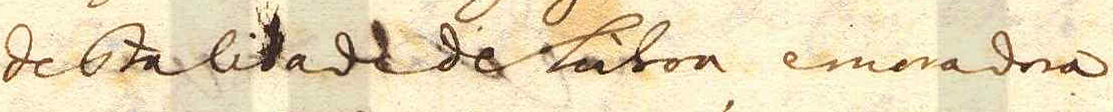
desta cidade de Lisboa, e moradora
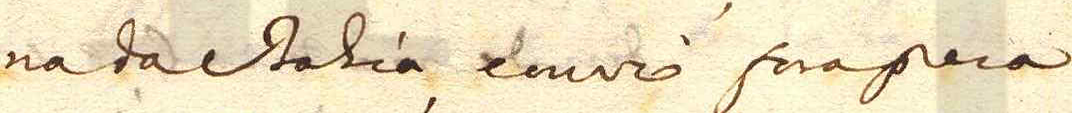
na da Bahia, e ouvio fora preza
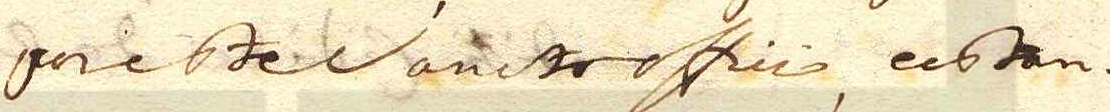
por este Sancto officio, e estan
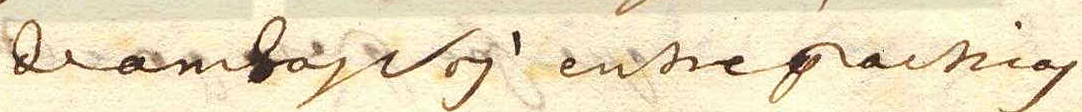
do ambos sós entre practicas
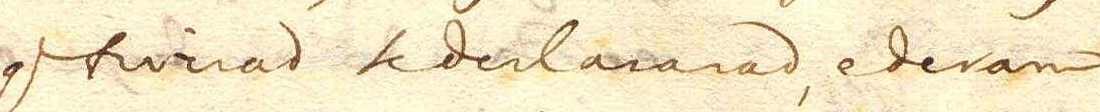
q̄ tiveraõ se declararaõ, e deram
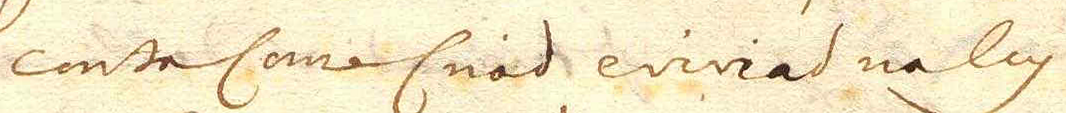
conta Como Criaõ e viviaõ na ley
